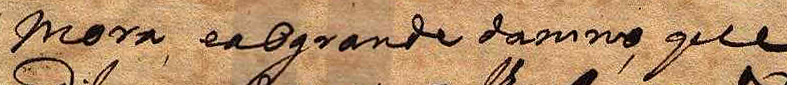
mora, e ao grande damno, que
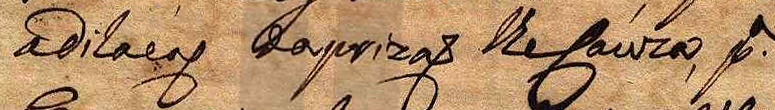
a dilaçaꝭ da prizaõ lhe Cauza, p.a
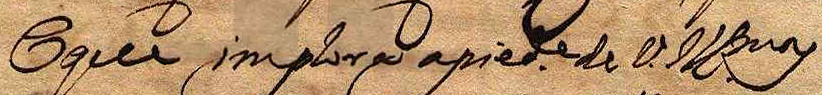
O que implora a pied.e de V. Ill.mas
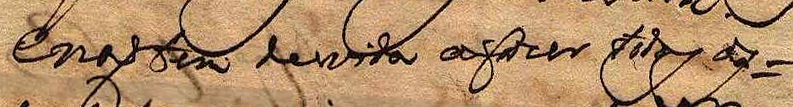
e naõ tem duvida a fazer todos os
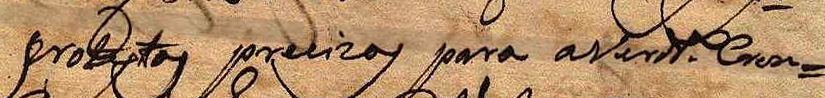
protestos precizos para a verdr.a Cren
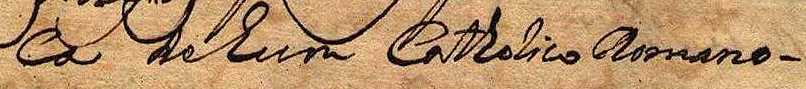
Ça de hum Catholico Romano
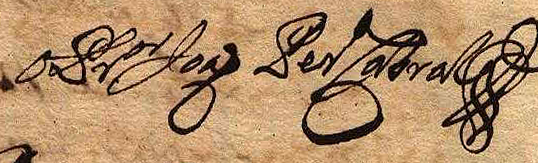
o Pr.o Joaõ Pera Cabral
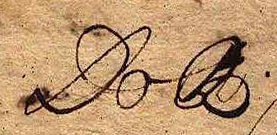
Do R.
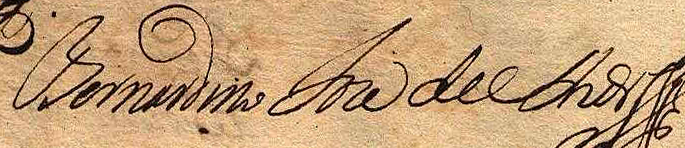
Bernardino Ioze de Andre
